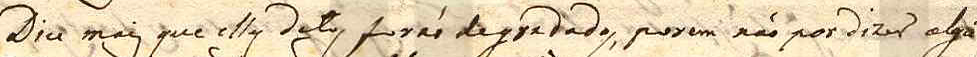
Dice mais que elles ditos foraõ degredados, porem naõ por dizer algū
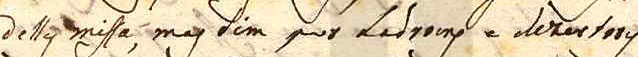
delles missa, mas sim por Ladroens e dezertores
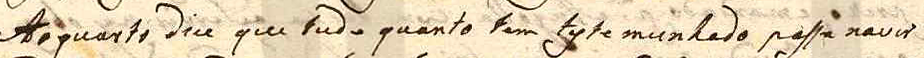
Ao quarto dice que tudo quanto tem testemunhado passa na ver
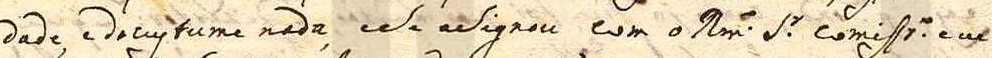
dade, e do custume nada, e se asignou com o Rm.o S.r Comissr.o e eu
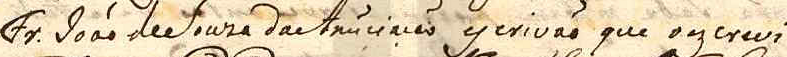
Fr. Ioão de Souza da Anūciaçaõ escrivaõ que o ezcrevi
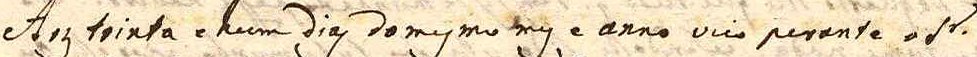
Aoz trinta e hum dias do mesmo mes e anno veio perante o Sr.
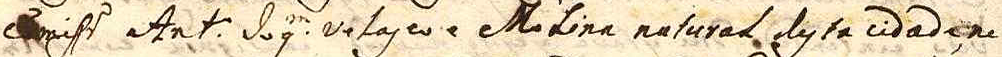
c_missr.o Ant.o Ioqm. veLasco e MoLina natural desta cidade, ne
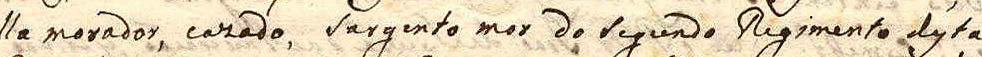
lla morador, cazado, sargento mor do segundo Regimento desta
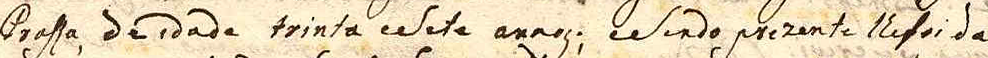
Prassa, de idade trinta e sete annoz; e sendo prezente lhe foi da
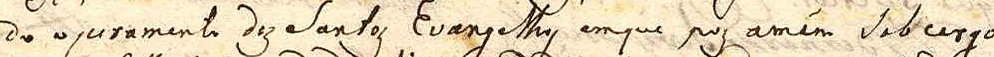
do o juramento doz Santoz Evangelhos em que poz a mãm sob cargo
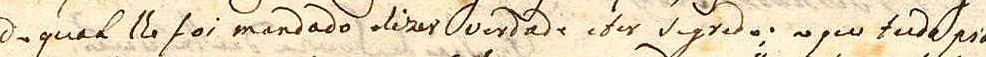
do quaL lhe foi mandado dizer verdade e ter segredo; o que tudo pro
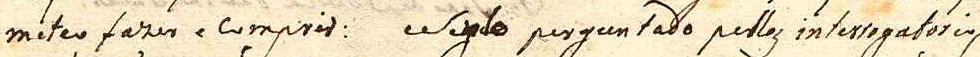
meteo fazer e cumprir: e segdo perguntado pelloz interrogatorios
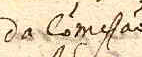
da Cōmissão
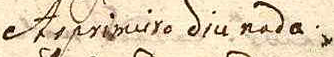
Ao primeiro dice nada;
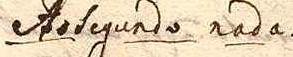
Ao segundo nada.
